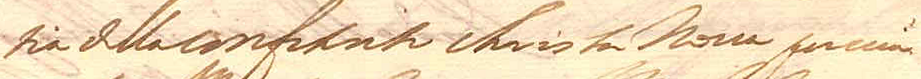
tia della confitente christa Noua per uia
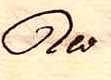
Reo
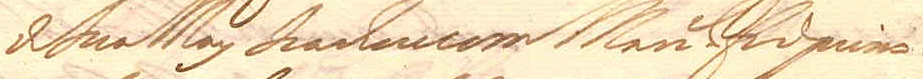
de sua May se achou com Man.el frz̄ primo
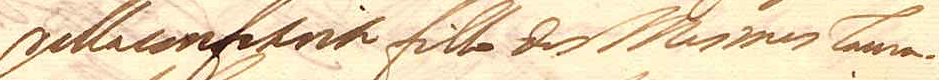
della confitente filho dos Mesmos laura
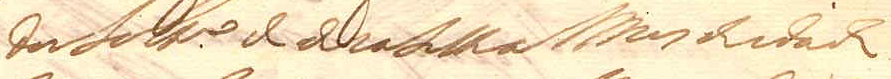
dor solt.ro de dezasette aNNos de idade
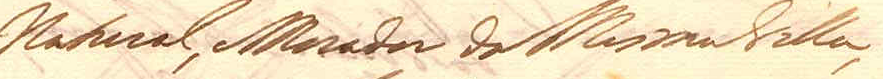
Natural e Morador da Mesma Villa
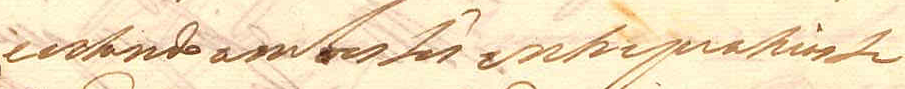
e estando ambos sós entregue a tios se
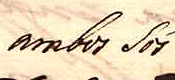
ambos Sós
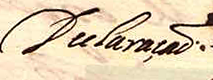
Declaraçaõ.
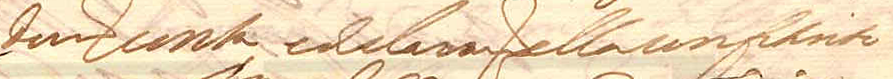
deraõ conta e declararaõ ella confitente
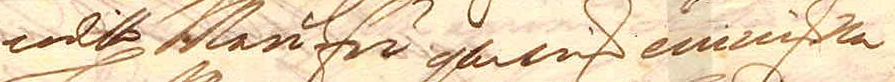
e o ditto Man.el frz̄ que criaõ e uiuiaõ Na
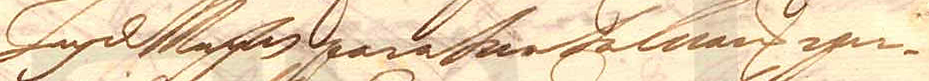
Ley de Moyses para sua saluaçaõ e per
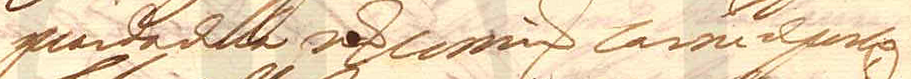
guarda della naõ comiaõ carne de porco
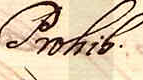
Prohib.
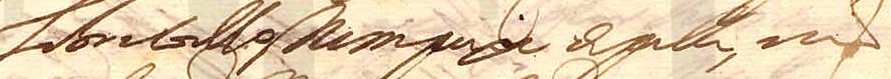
Lebre Coelho Nem peixe de pelle naõ
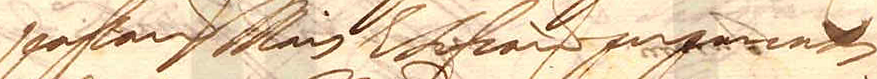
passaraõ Mais e se fiaraõ per parentes
